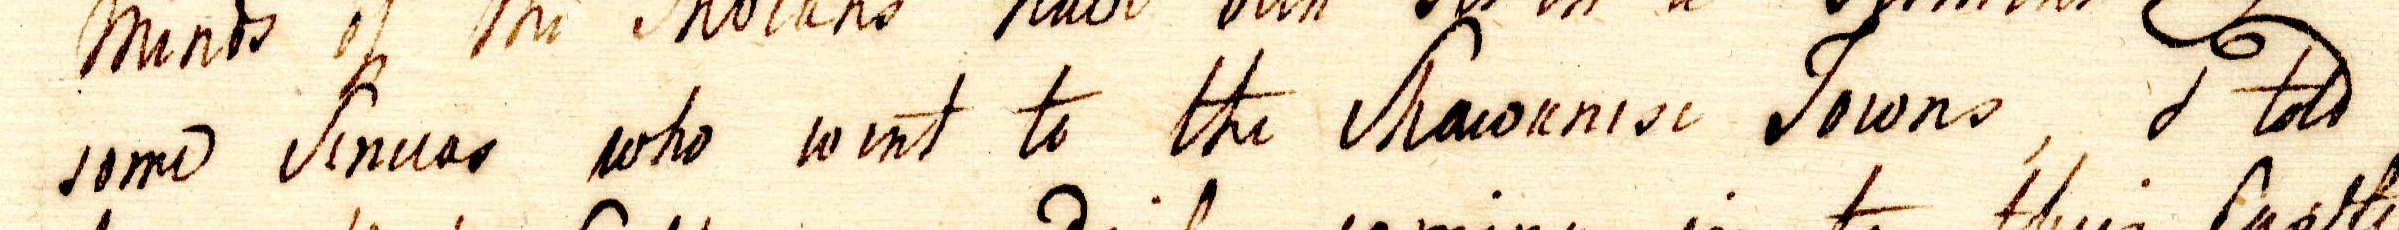some Senecas who went to the Shawanese Towns, & told
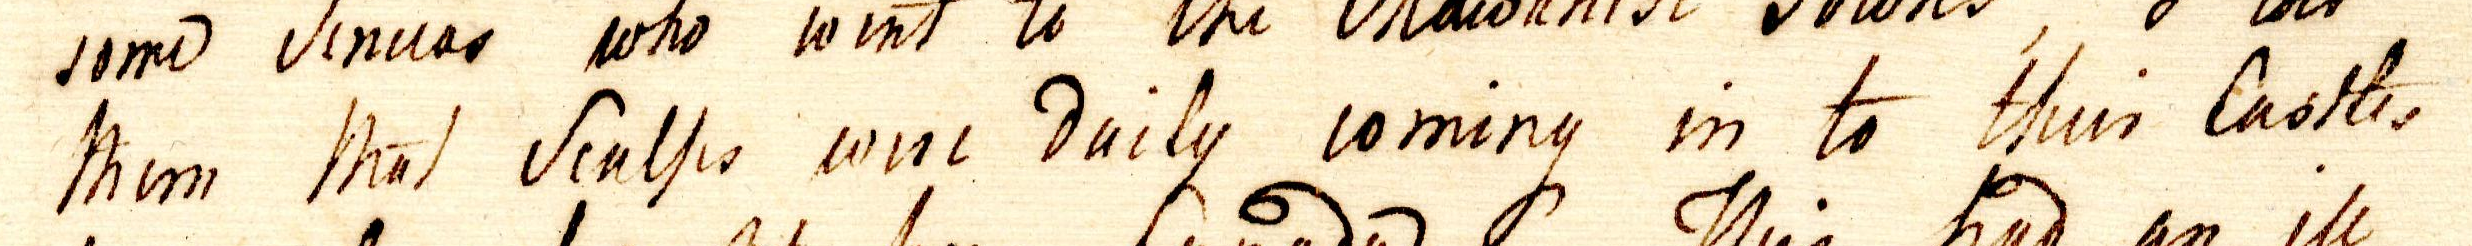them that Scalps were daily coming in to their Castles
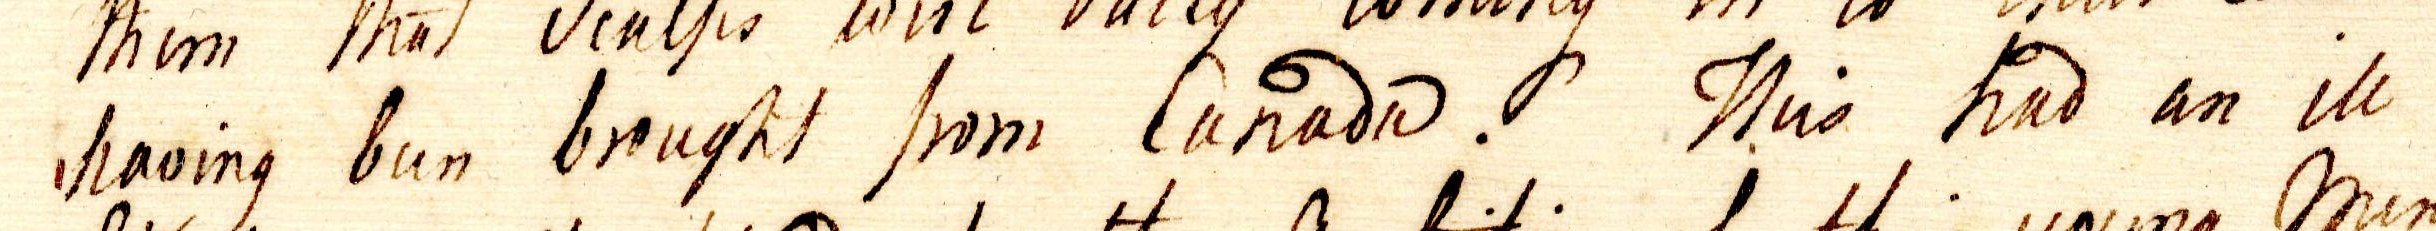having been bought from Canada. This had an ill
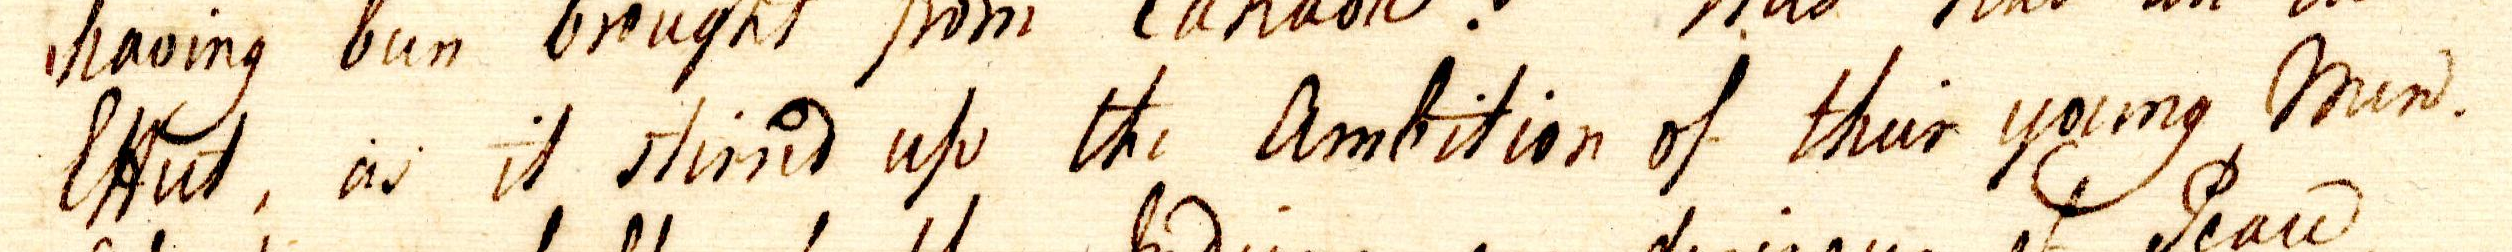Effect, as it stirred up the Ambition of their young Men.
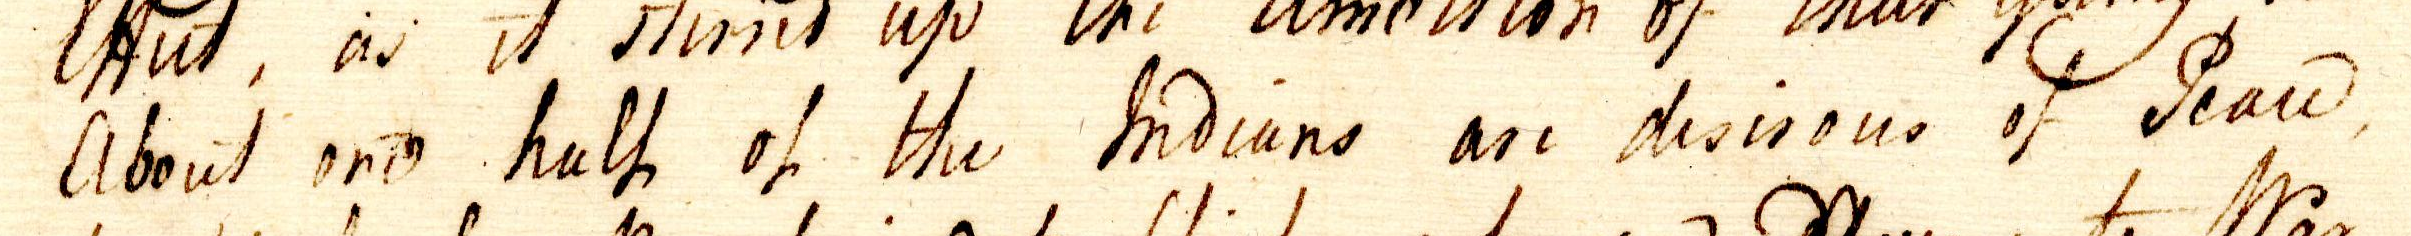About one half of the Indians are desirous of Peace,
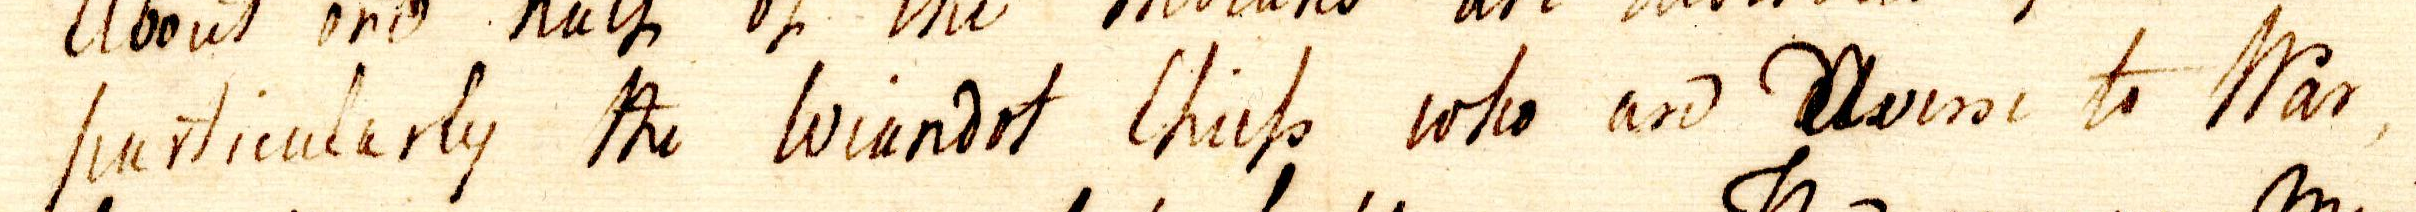particularly the Wiandot Chiefs who are Averse to War
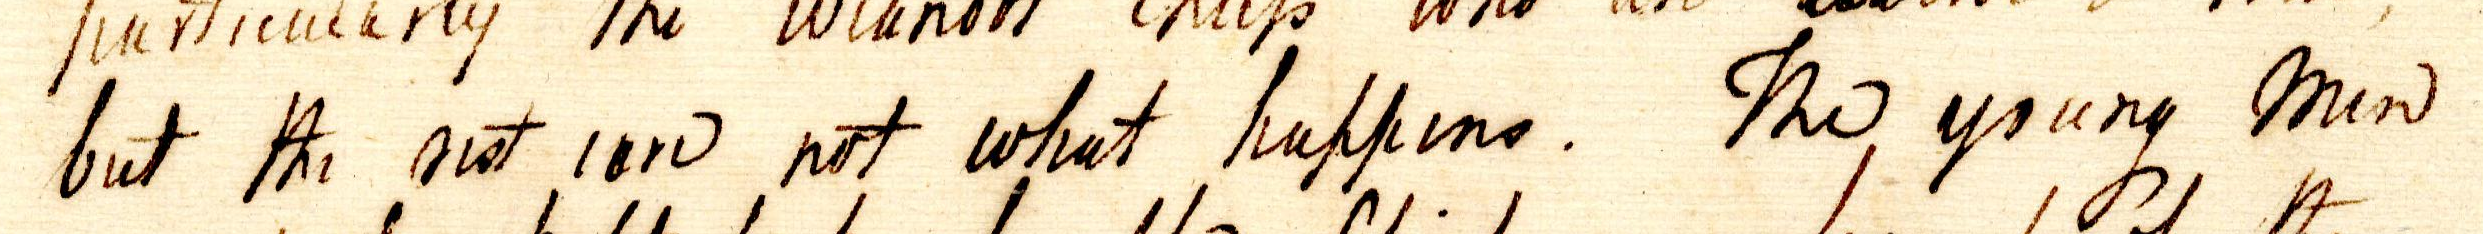but the rest care not what happens. The young Men
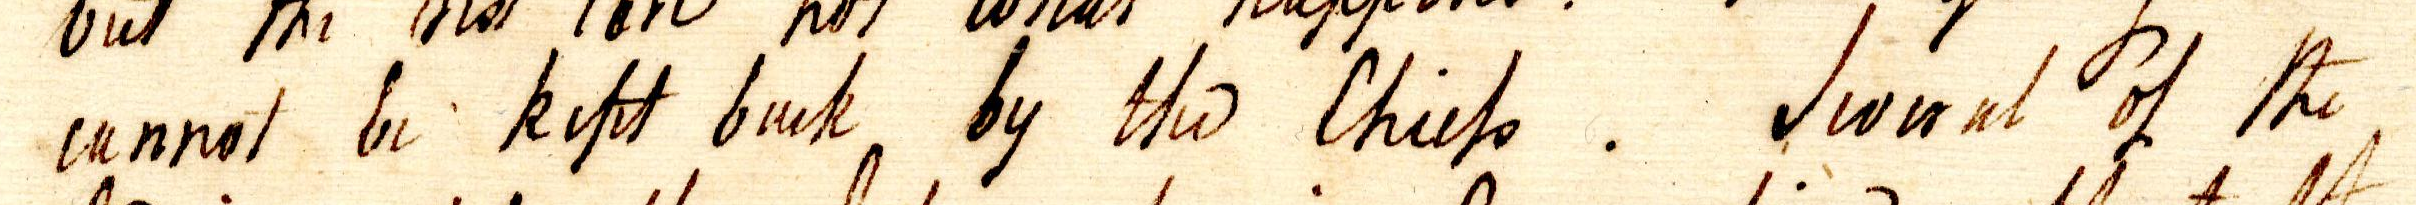cannot be kept back by the Chiefs. Several of the
